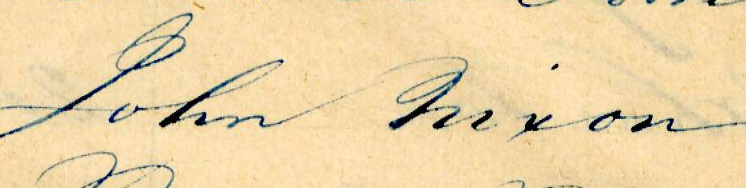John Nixon
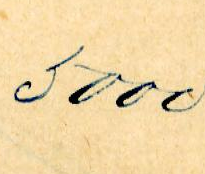5000
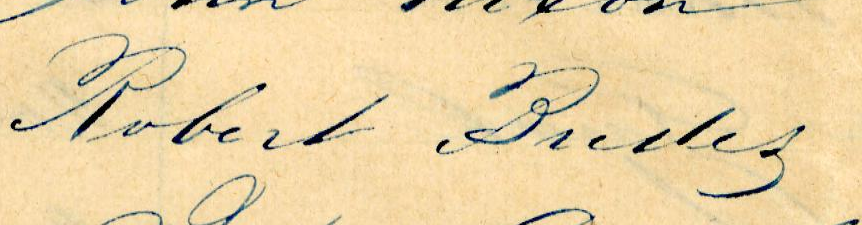Robert Brules
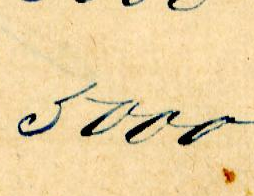5000
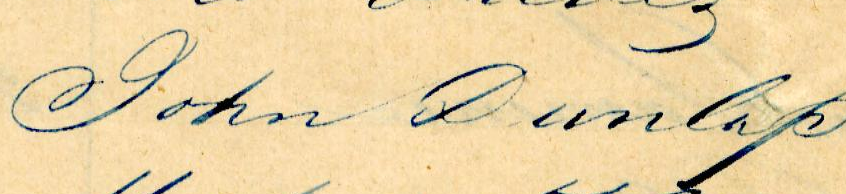John Dunlap
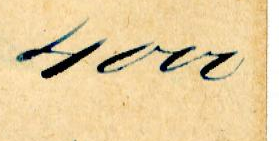4000
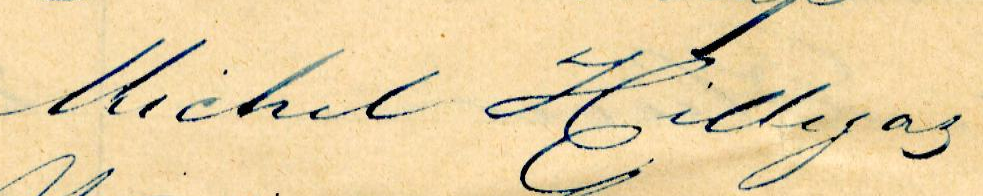Michel Hillegas
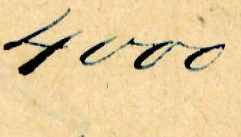4000
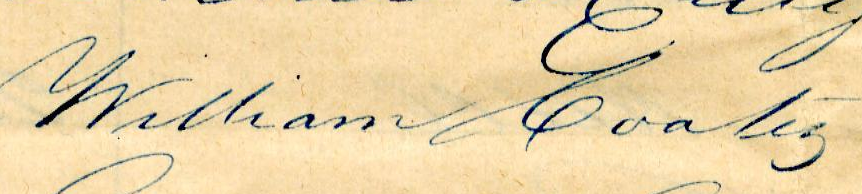William Gratz
